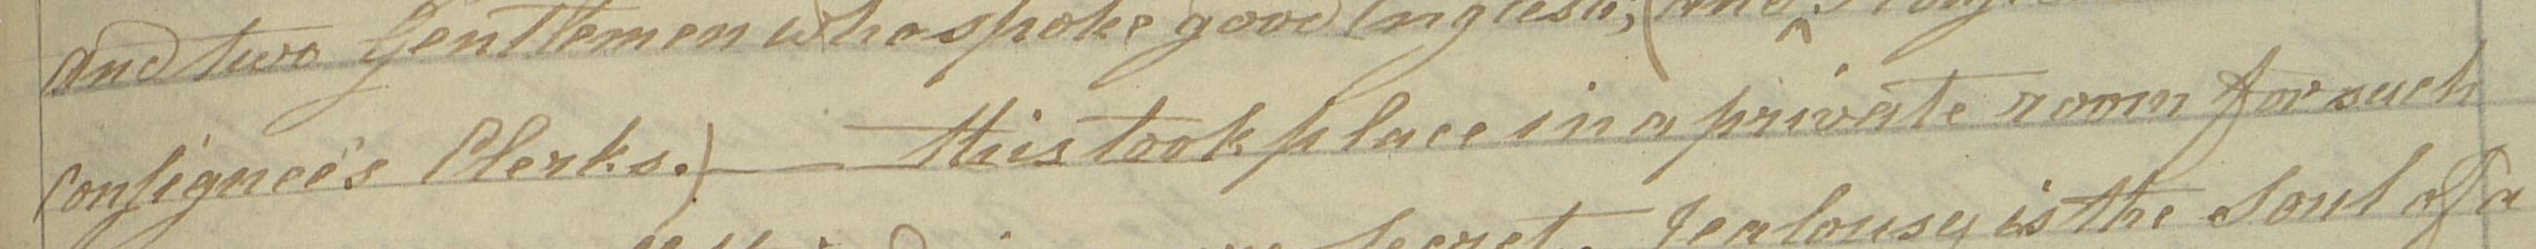Consignee's Clerks.) this took place in a private room for such
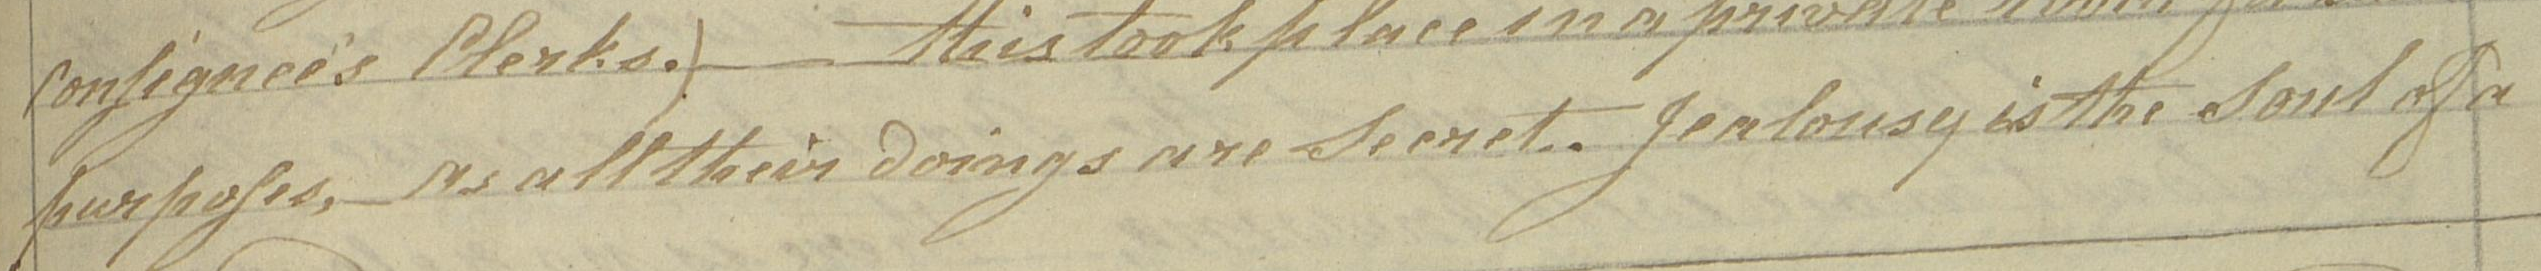purposes, as all their doings are Secret. Jealousy is the Soul of a
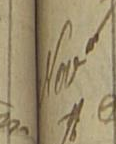Nov^r
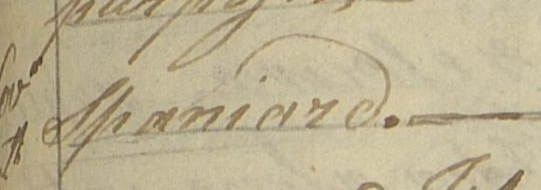Spaniard.
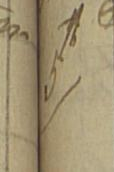5^th
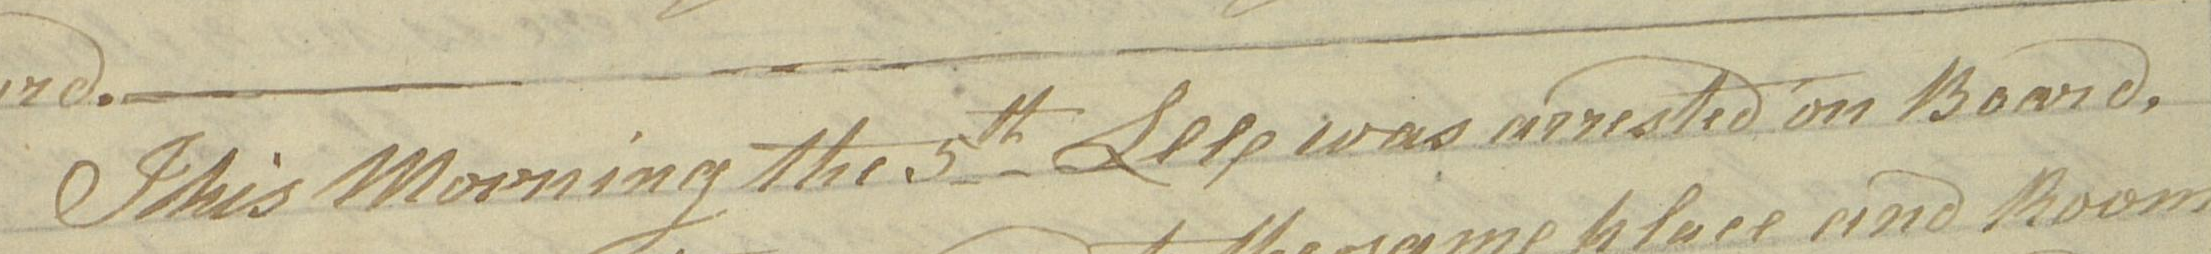This Morning the 5^th Lee was arrested on Board.
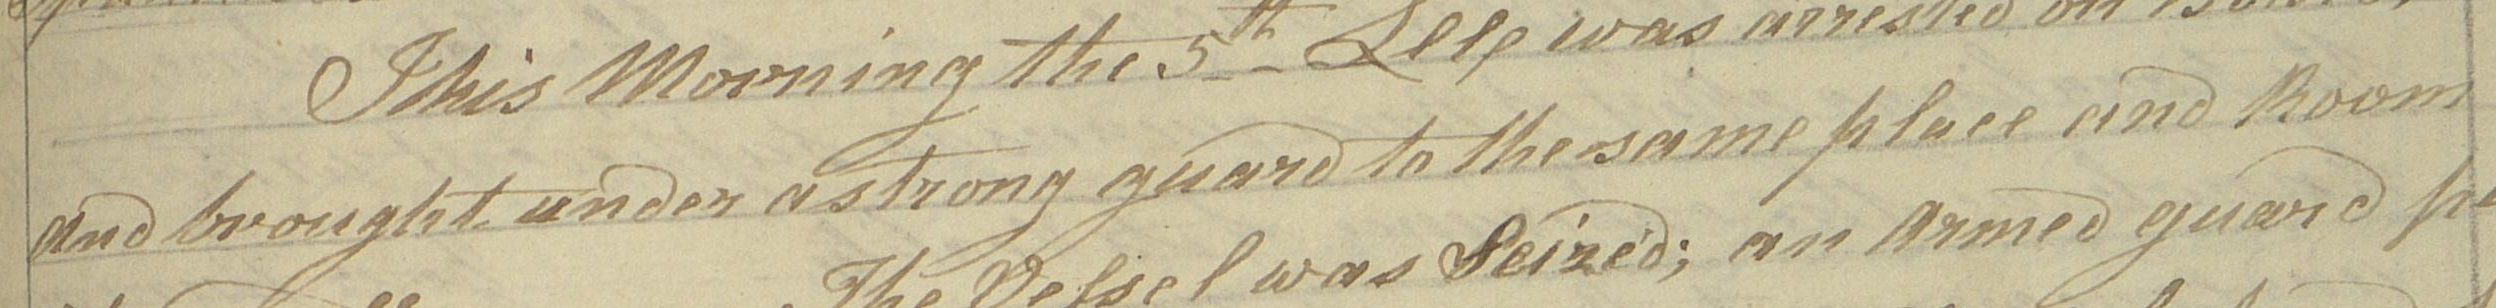and brought under a strong guard to the same place and Room
